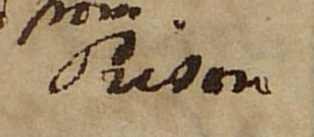Prison
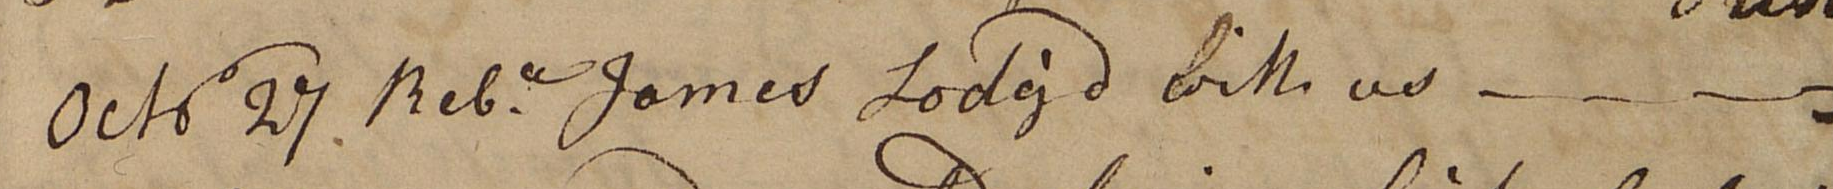Octo^r 27 Reb^a. James Lodg'd with us---
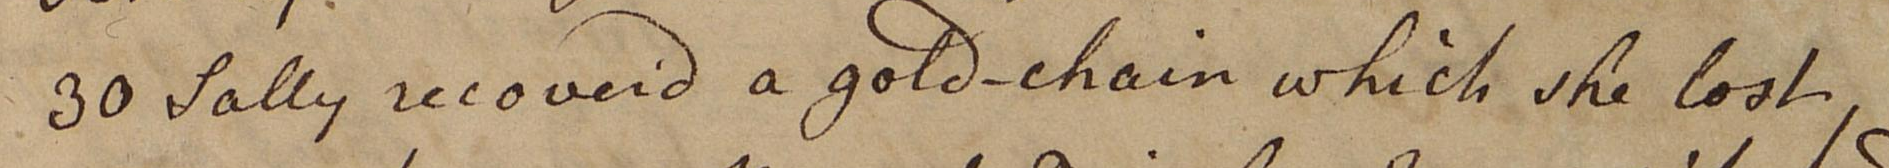30 Sally recover'd a gold-chain which she lost
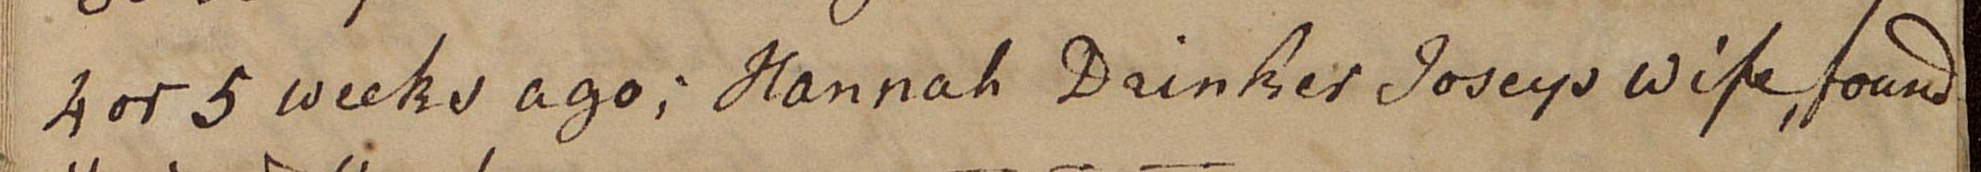4 or 5 weeks ago; Hannah Drinker Joseys wife, found
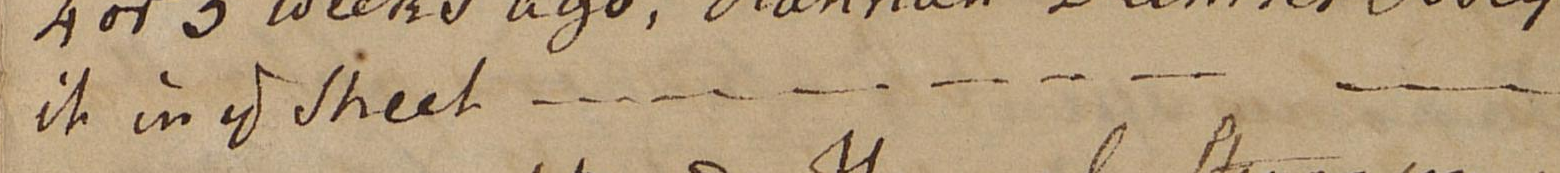it in y^e street-------- -
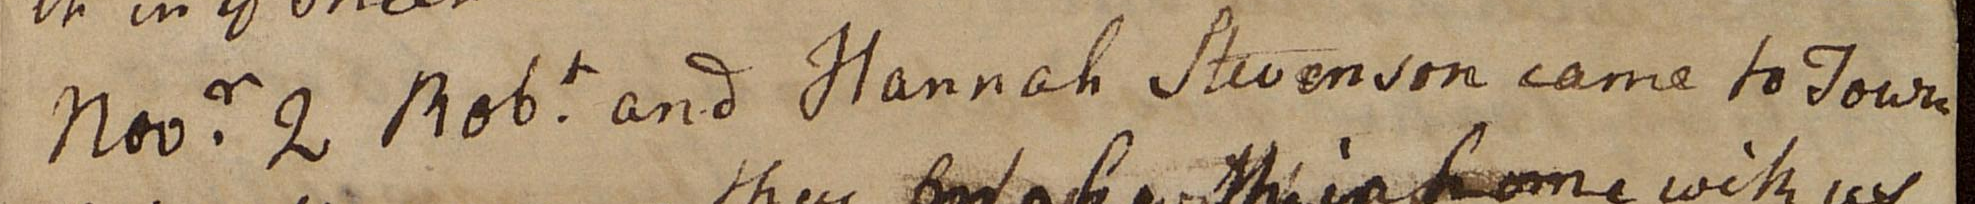Nov^r. 2 Rob^t. and Hannah Stevenson came to Town
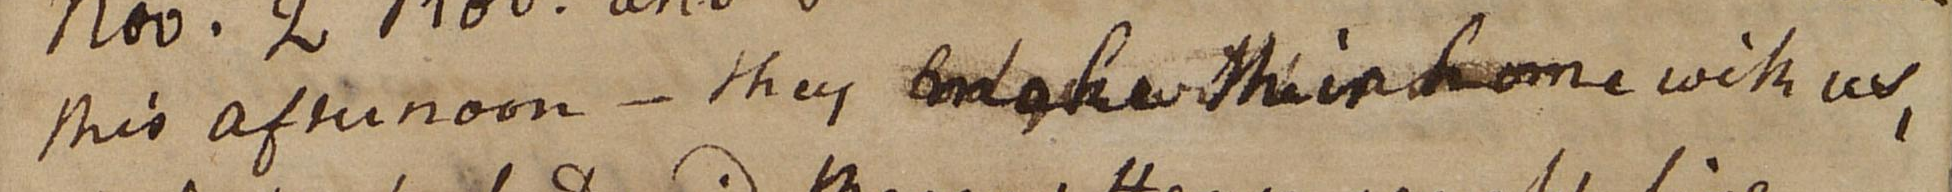this afternoon- they make their home with us,
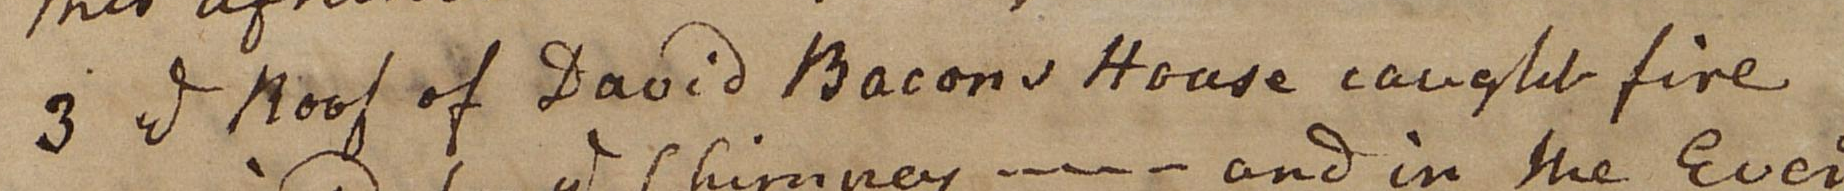3 y^e Roof of David Bacons House caught fire
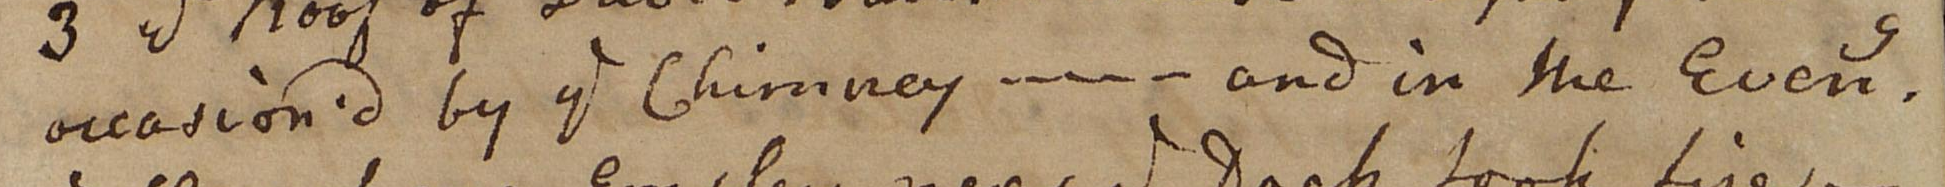occasion'd by y^e Chimney---- and in the Even^g.
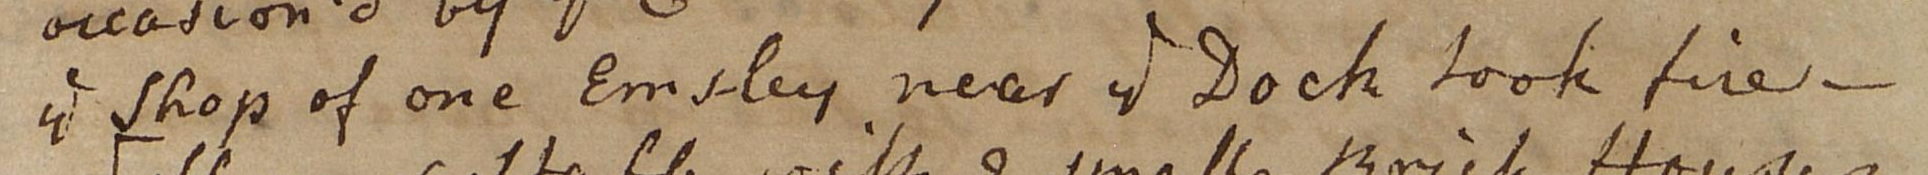y^e shop of one Emsley near y^e Dock took fire-
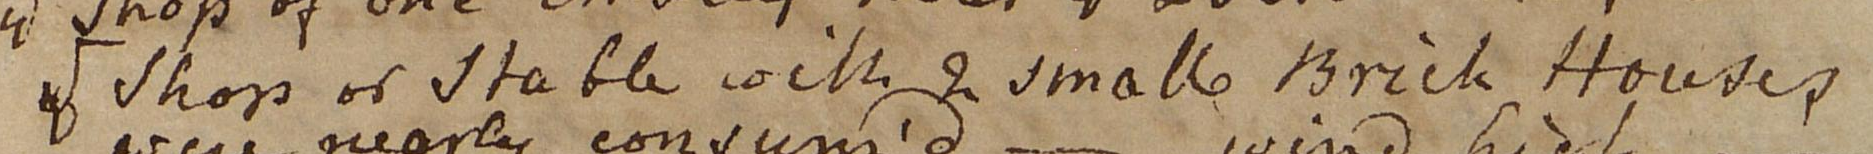y^e shops or Stable with 2 small Brick Houses
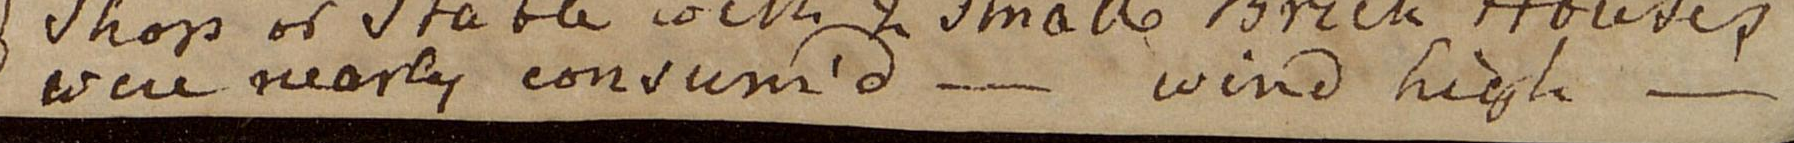were nearly consum'd- wind high-
